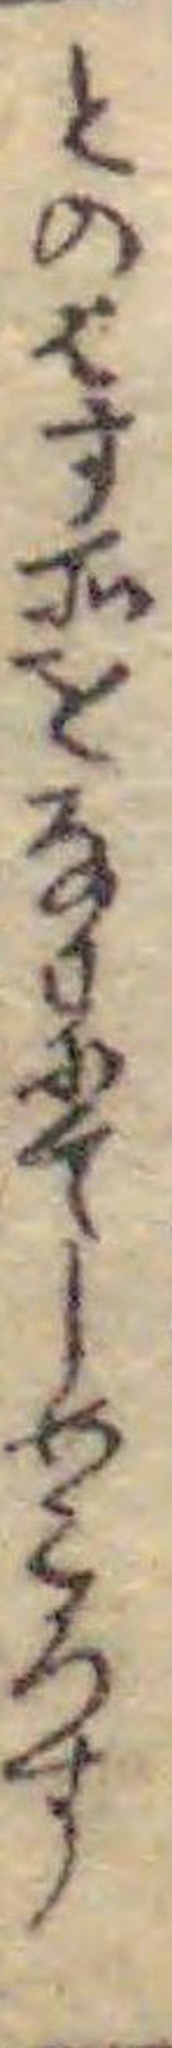とのはす所をなわにてしめころす

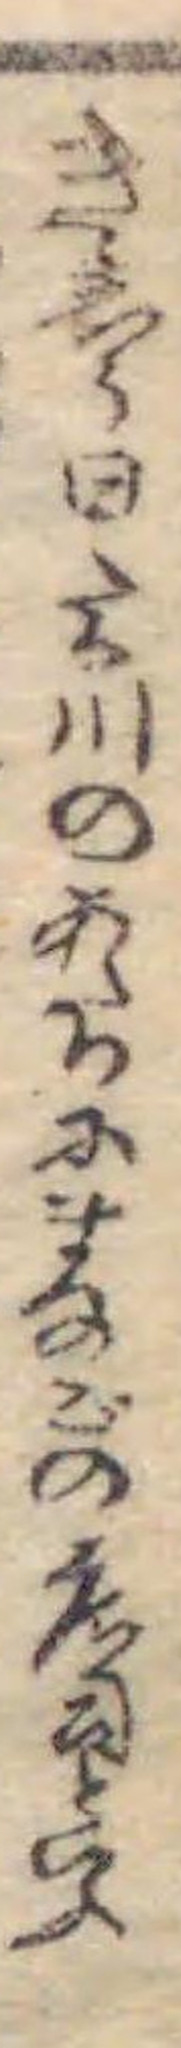きしう日たか川のあたりにまなごの庄司といふ
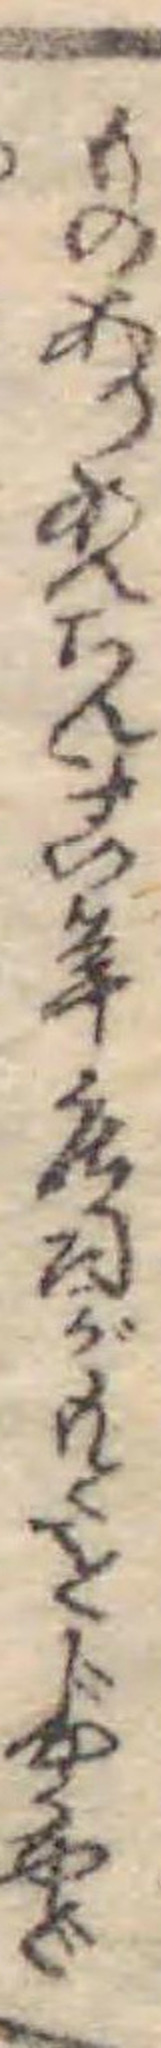ものありあんちんまい年庄司がもとをじやうやど
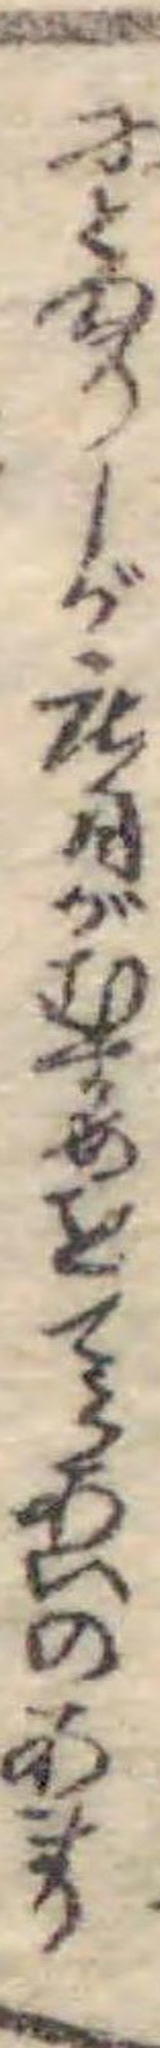にとまりしが庄司がむすめをてうあいのあまり
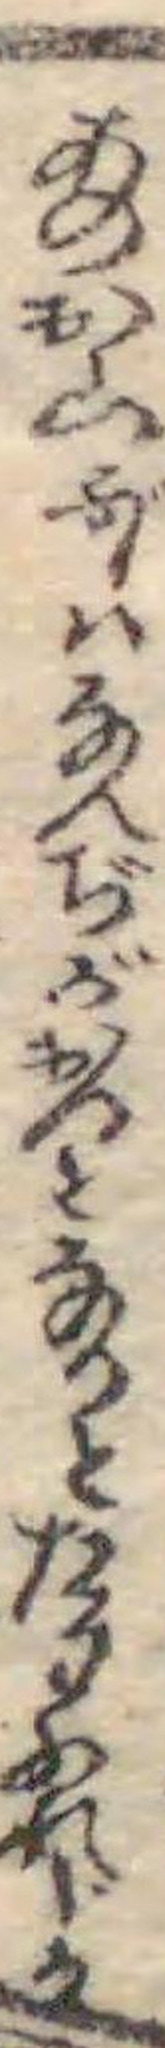あのお山ぶしはなんぢがおつとなりとたわふれしか
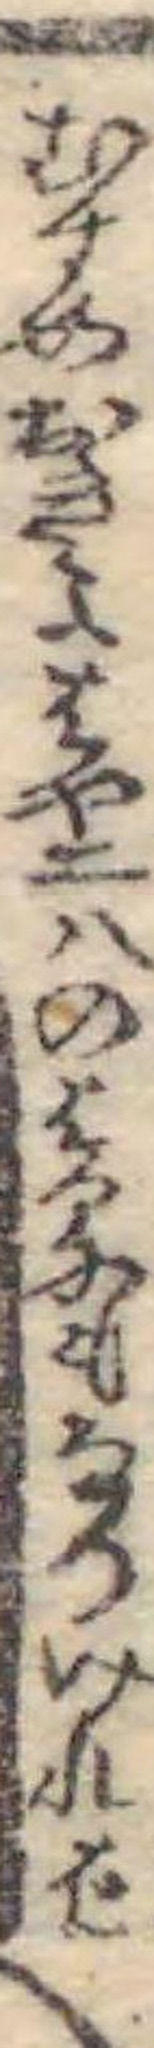むすめおきよはや二八のはるにもなりければ
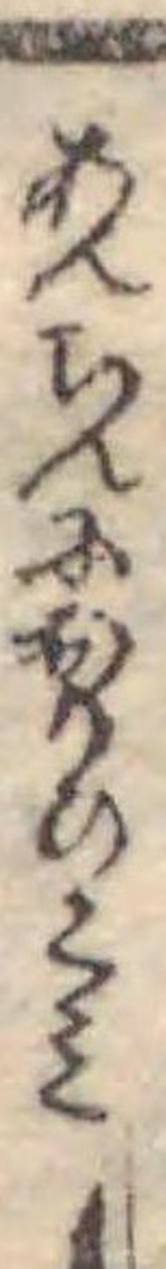あんちんにおもひこみ
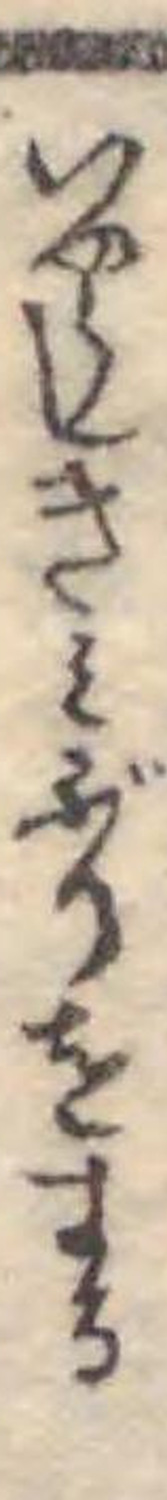いやらしきみぶりをする
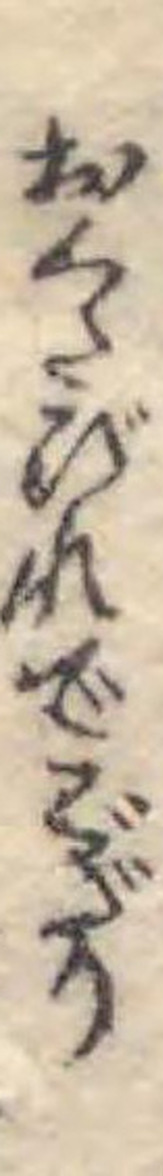おくたびれでござり
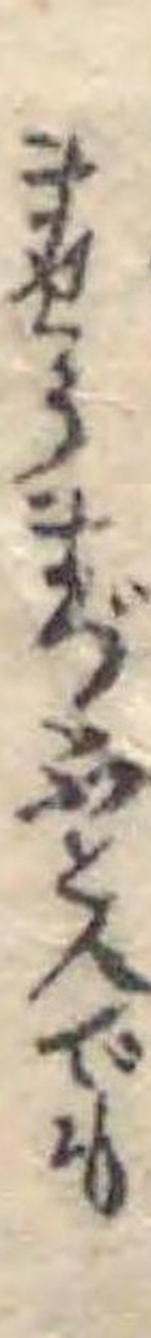ませうまづふとんでも
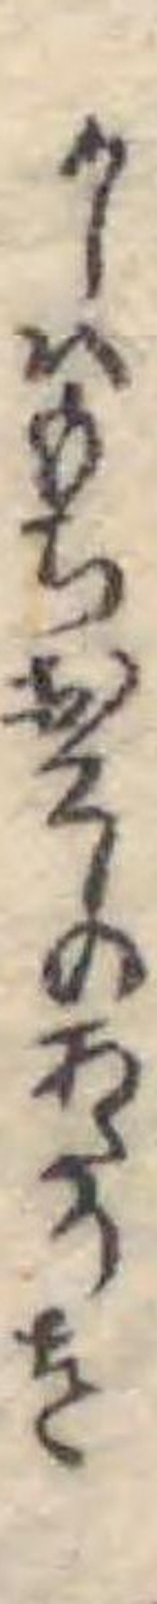かしはもちおこしのあたりを
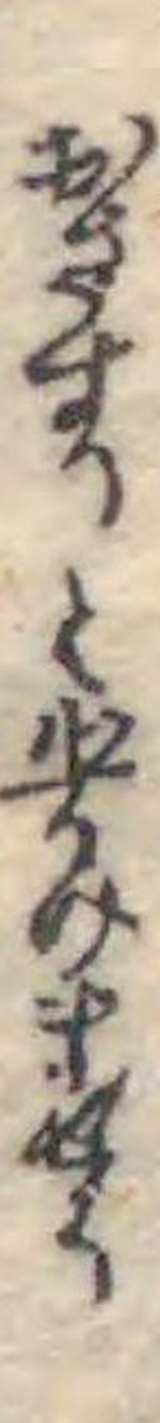おさすりと出かけませう
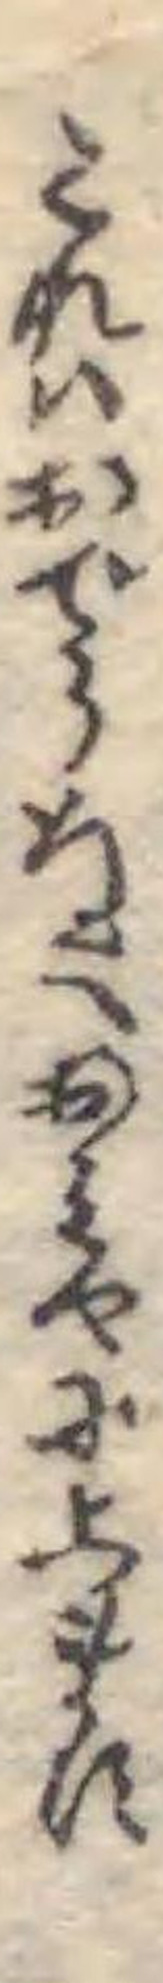これはおでうさまへおみやに上ます
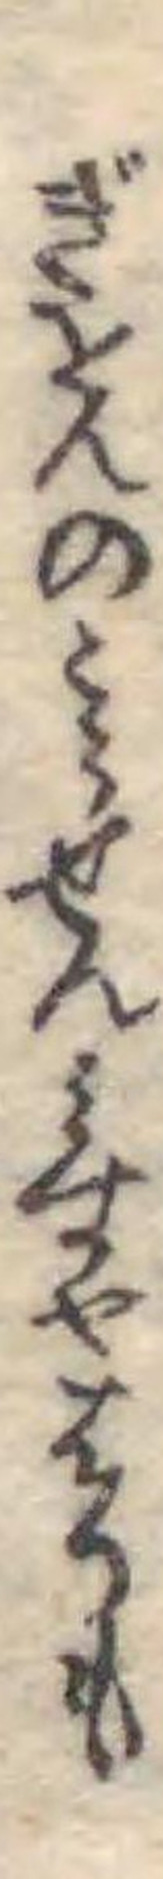ぎをんのこうせんみすやはりも
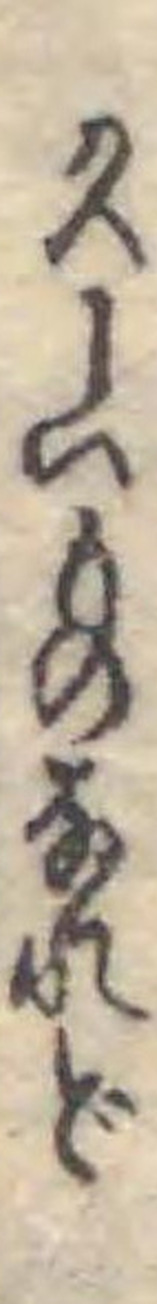久しいものなれど
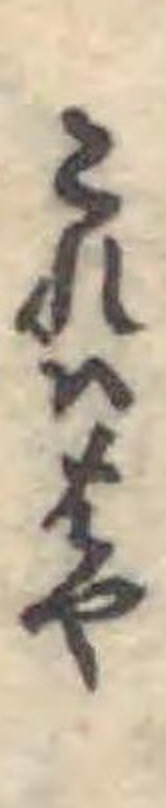これははや
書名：鐘入七人化粧 : 3巻
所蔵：国立国会図書館 National Diet Library, JAPAN
